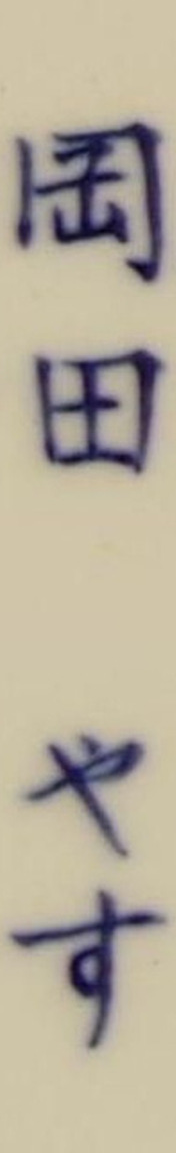岡田やす
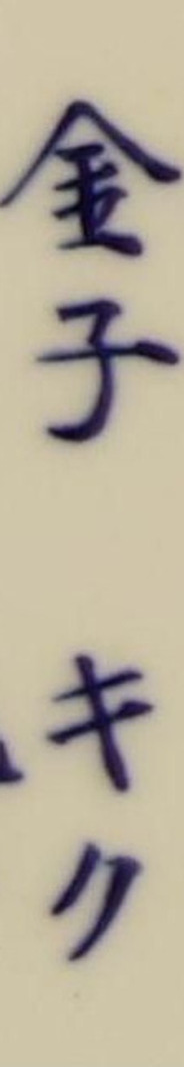金子キク
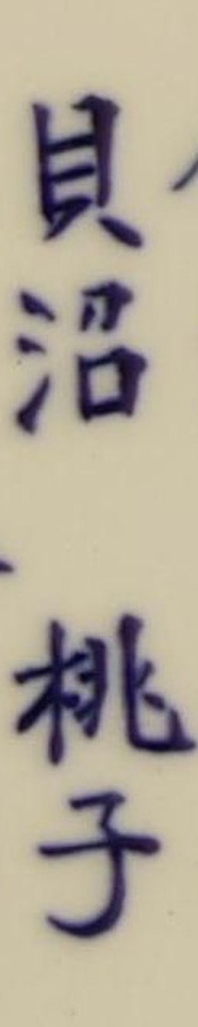貝沼桃子
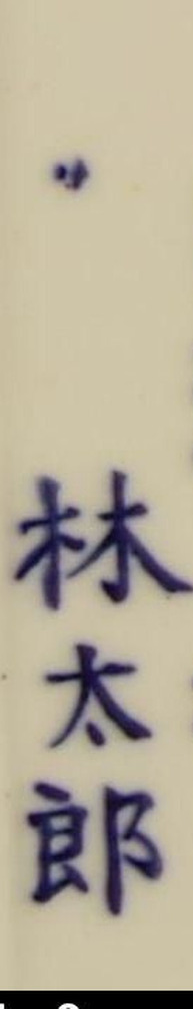林太郎
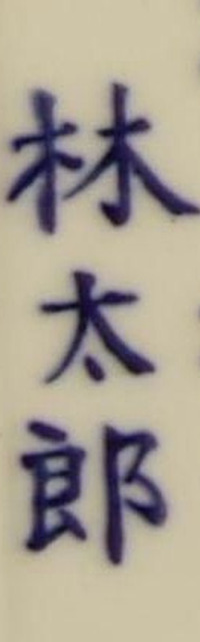林太郎

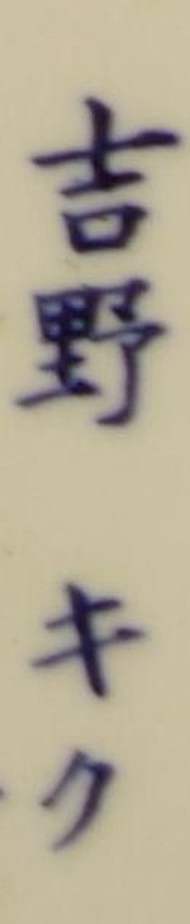吉野キク
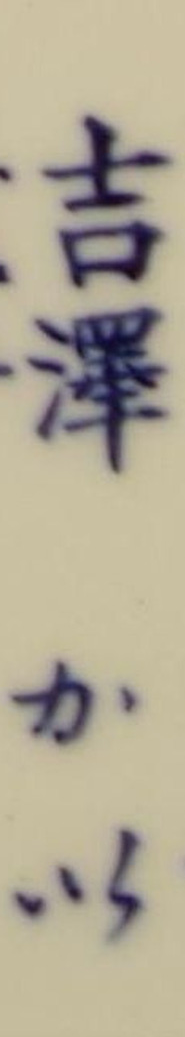吉澤かい
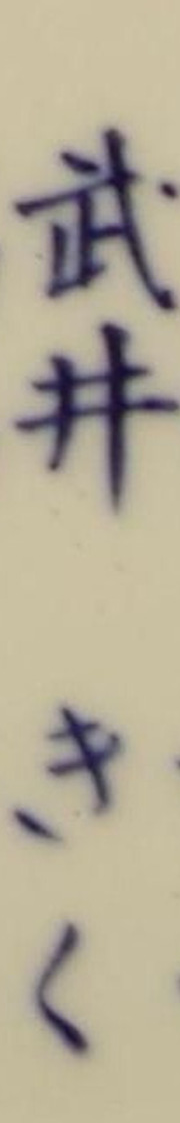武井きく
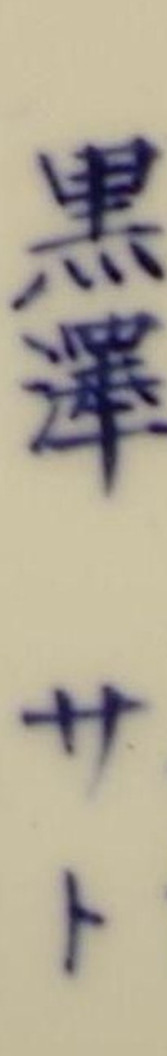黒澤サト
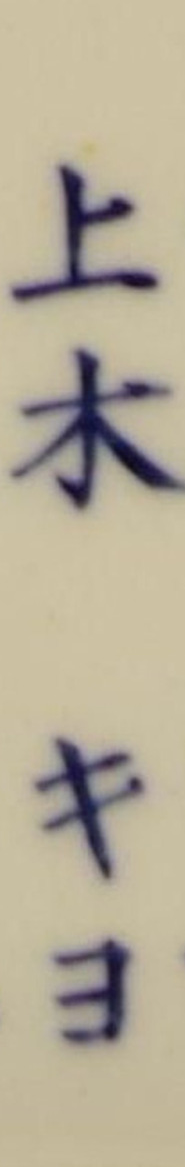上木キヨ
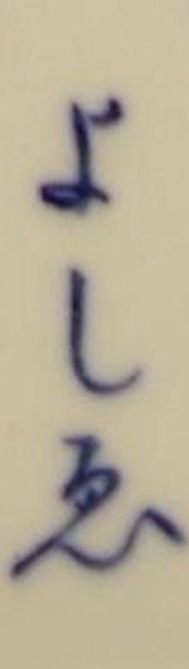よしえ
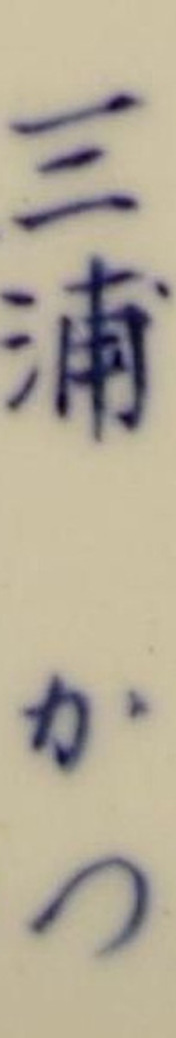三浦かつ
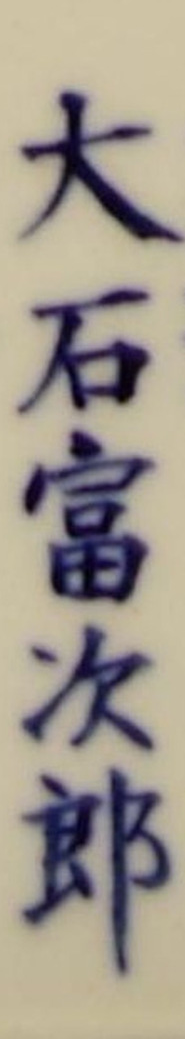大石富次郎
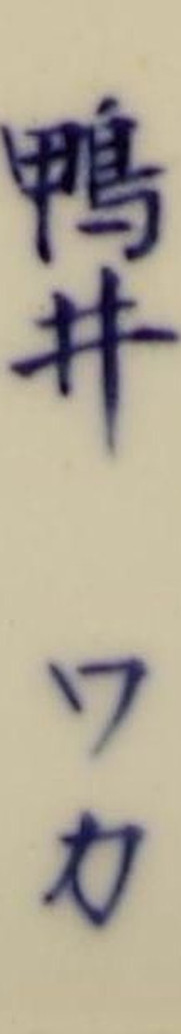鴨井ワカ
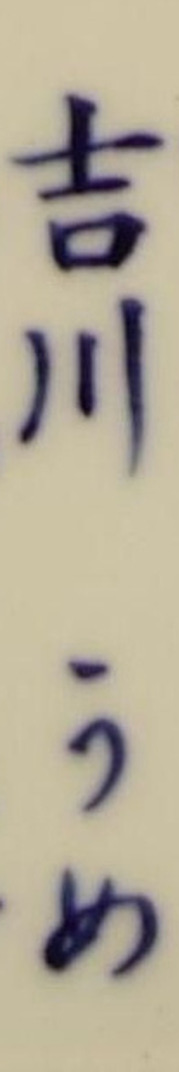吉川うめ
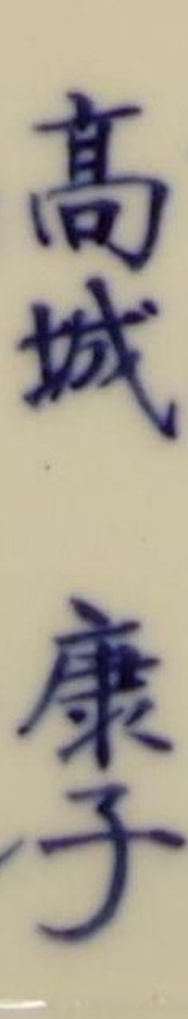高城康子
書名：E~L
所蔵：高野山金剛峯寺
